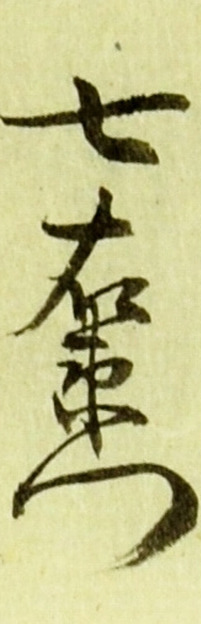彦右衛門
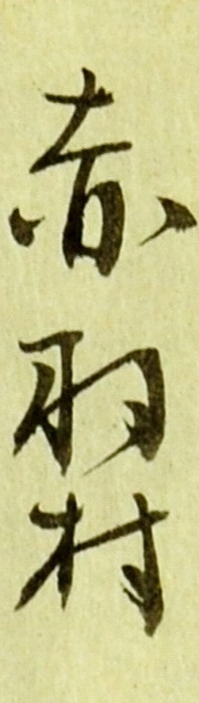赤羽村
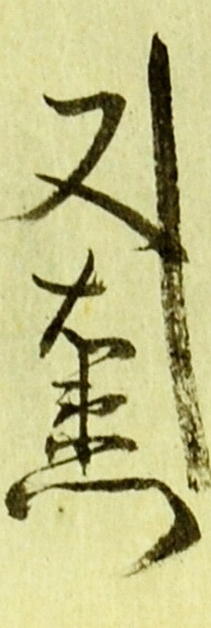彦右衛門
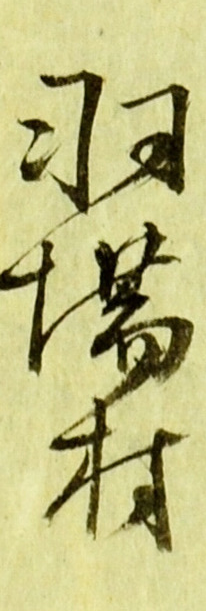羽場村
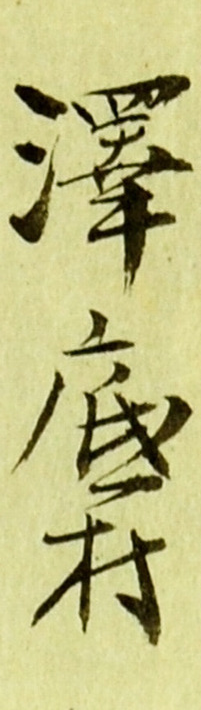沢底村
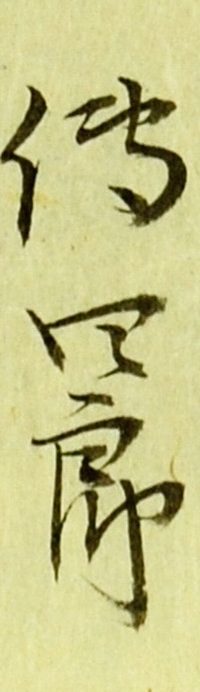伝四郎
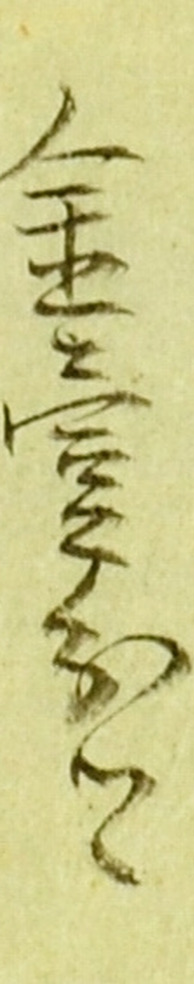金壱分和七
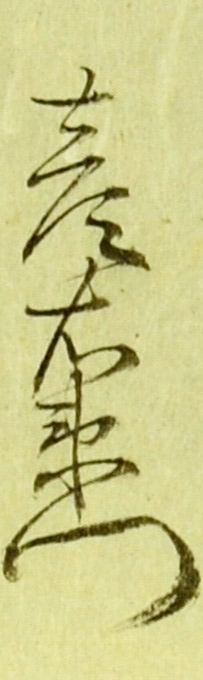彦右衛門
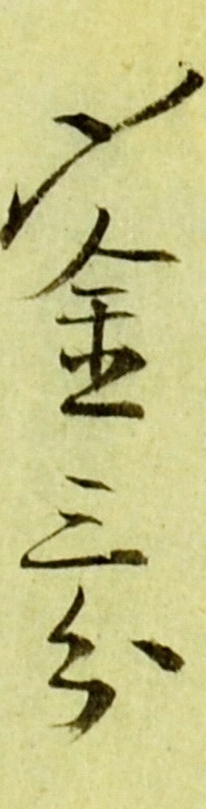〆金三分
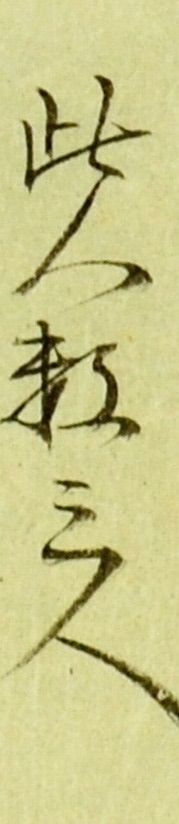此人数三人
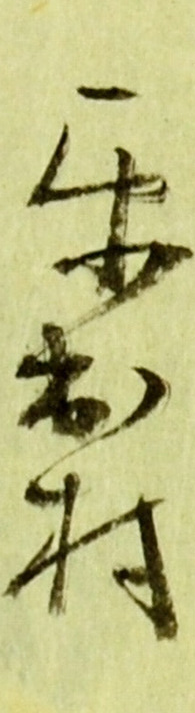平出村
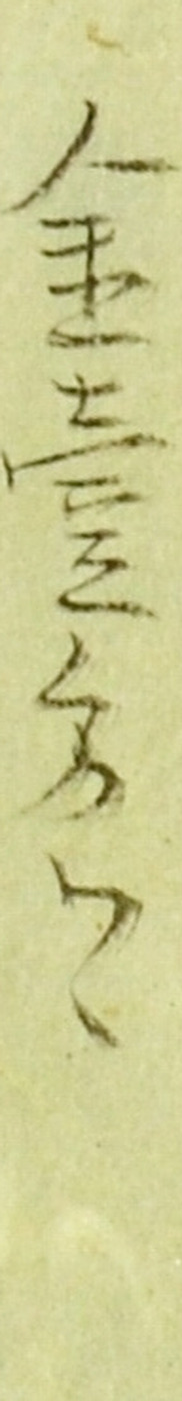金壱分和七
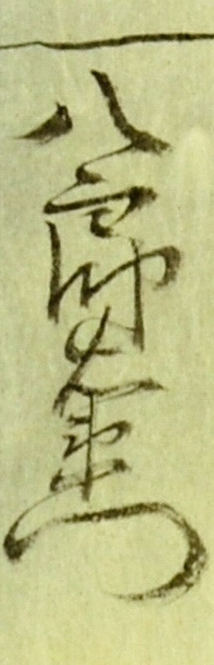八郎右衛門

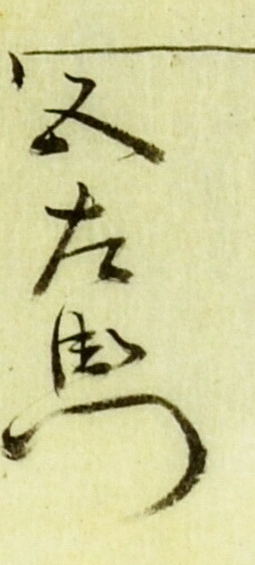五左衛門
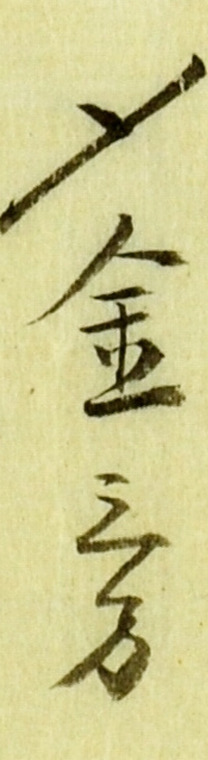〆金三分
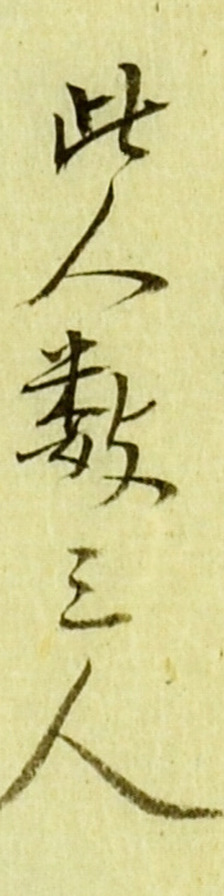此人数三人
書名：上伊那郷諸運上取調帳
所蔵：伊那市立高遠町図書館・合同会社AMANE
